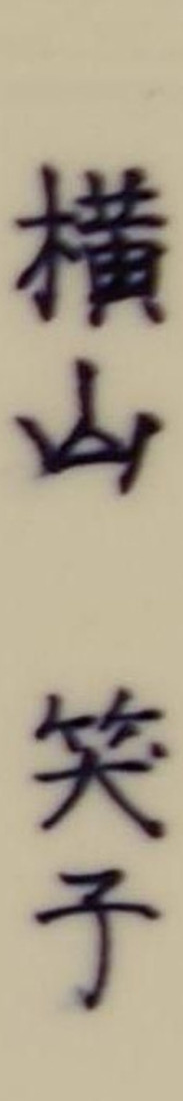横山笑子
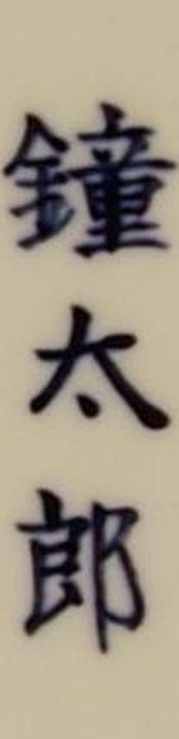鐘太郎
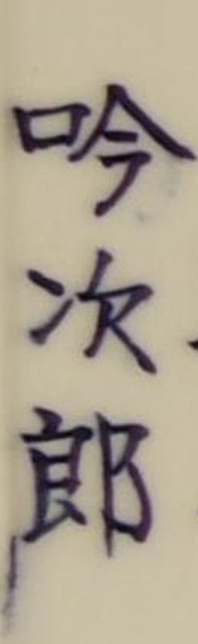吟次郎

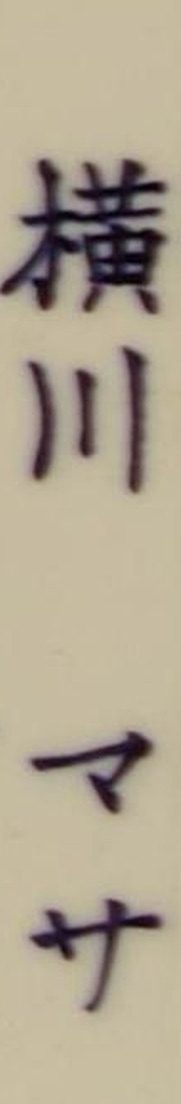横川マサ
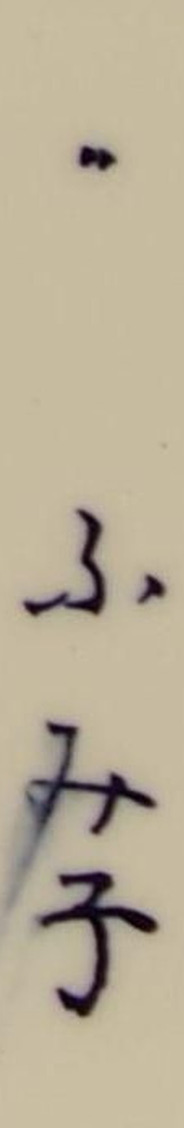ふみ子
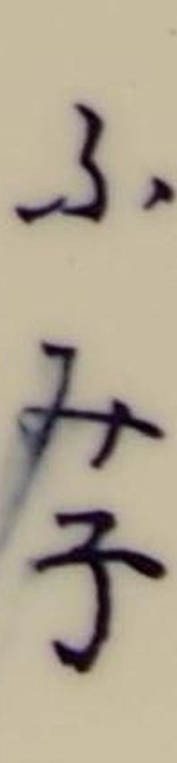ふみ子
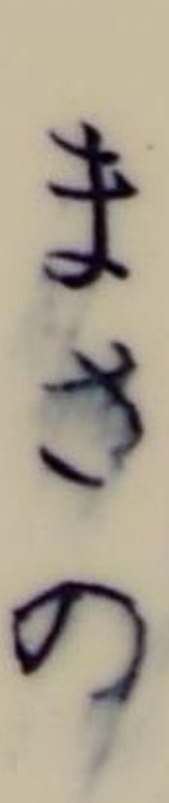まさの
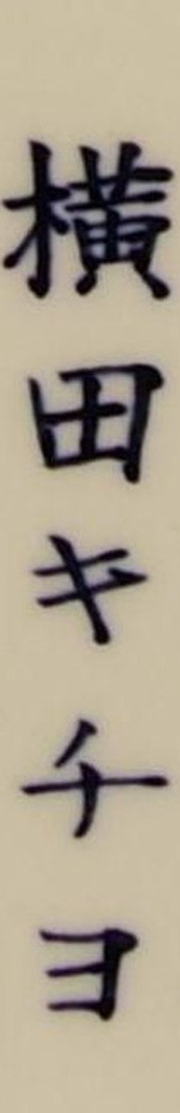横田キチヨ
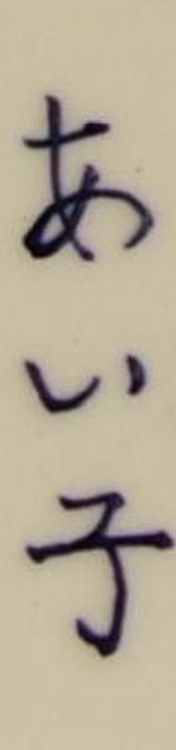あい子
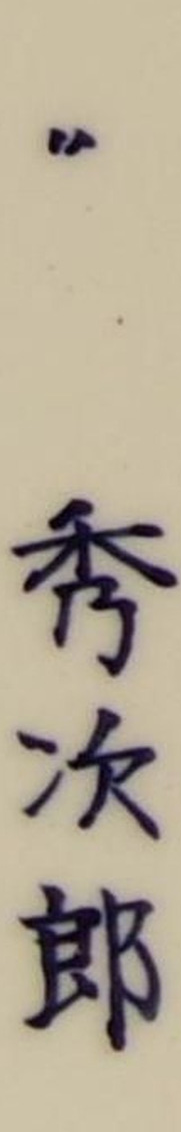秀次郎
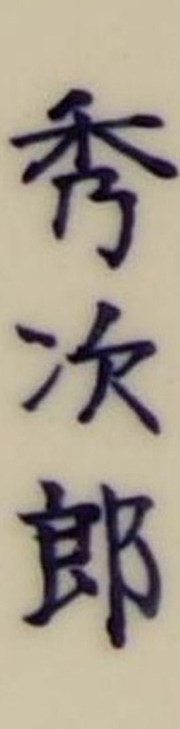秀次郎
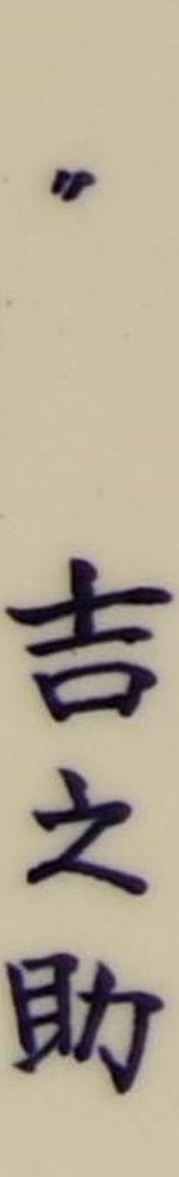吉之助
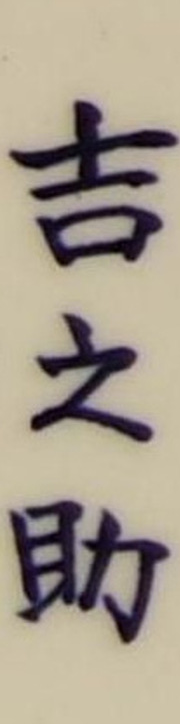吉之助
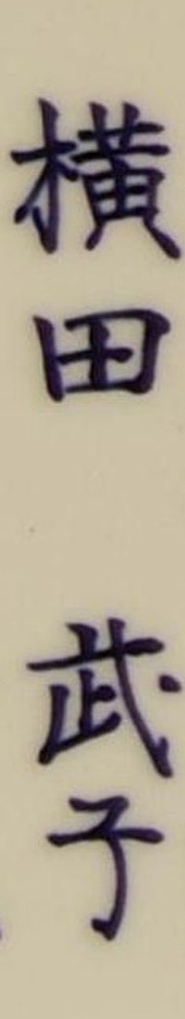横田武子

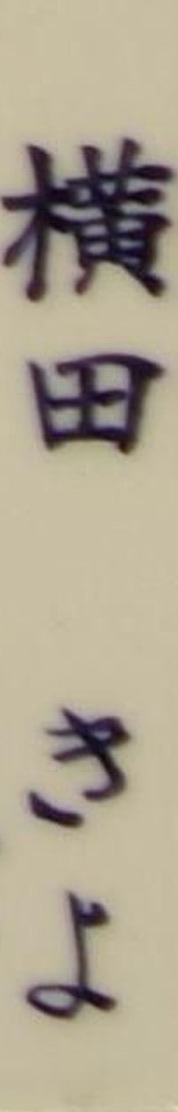横田きよ
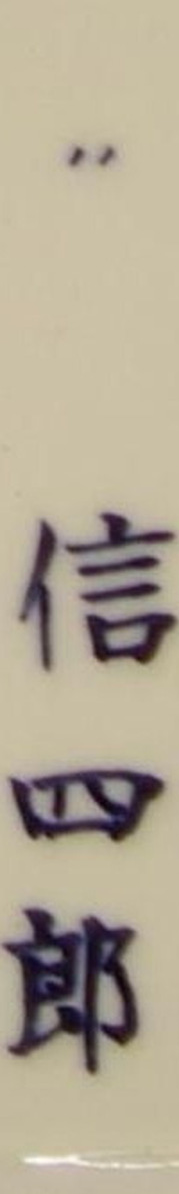信四郎
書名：A~D
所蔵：koyasan kongobuji
